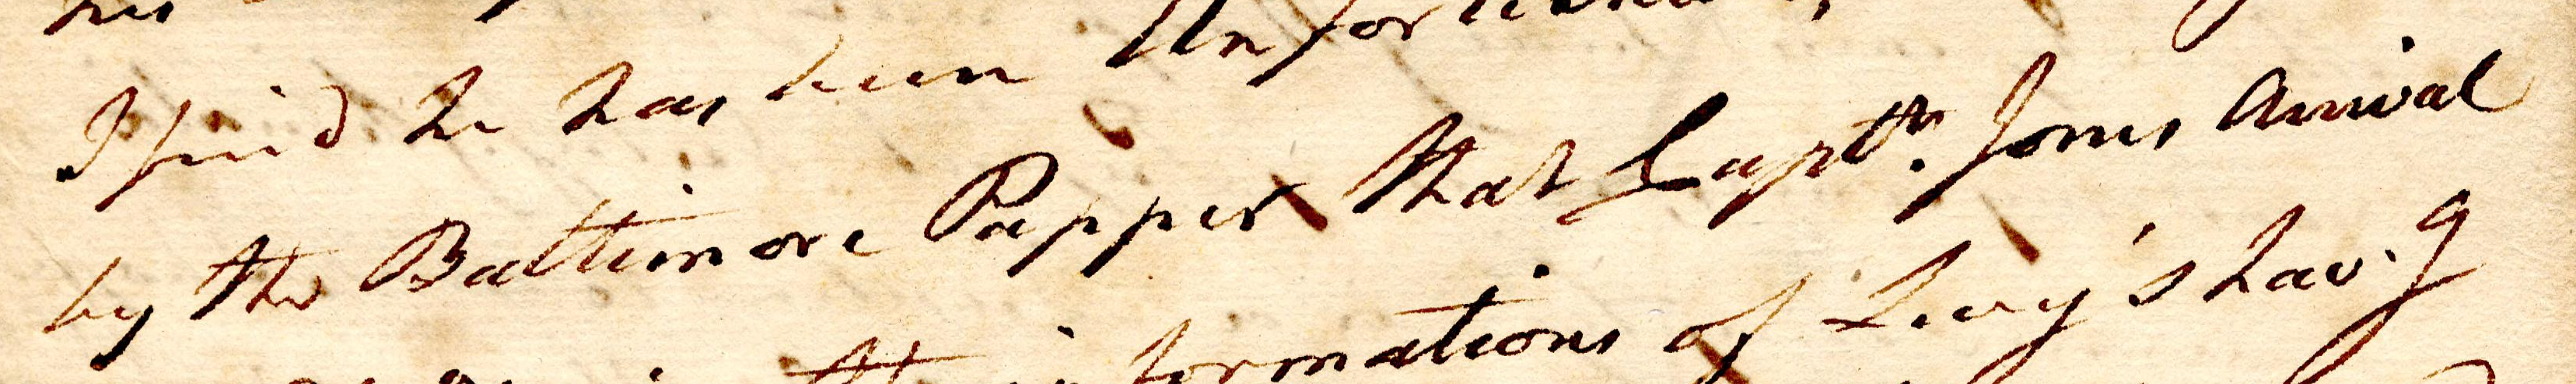by the Baltimore Papper that Capt^n. Jones Arrival
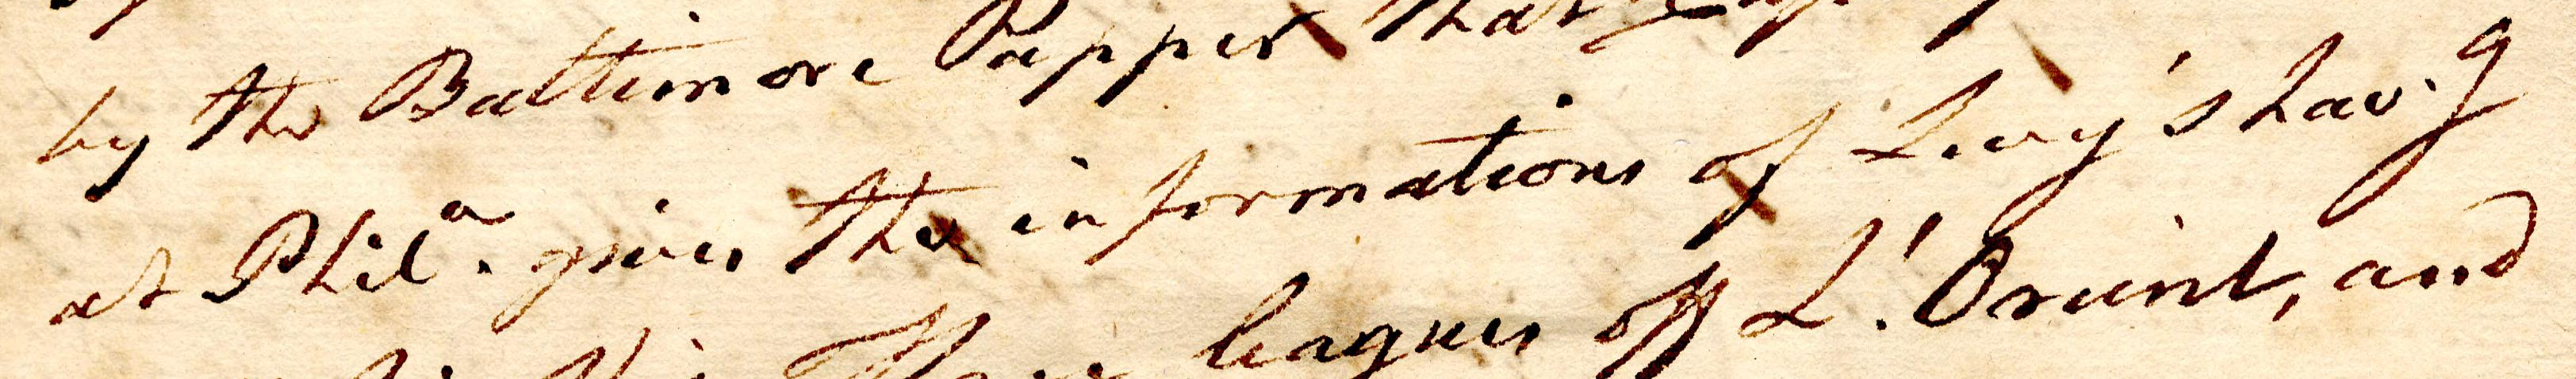at Phil^a. gives the informations of Lucy's hav^g.
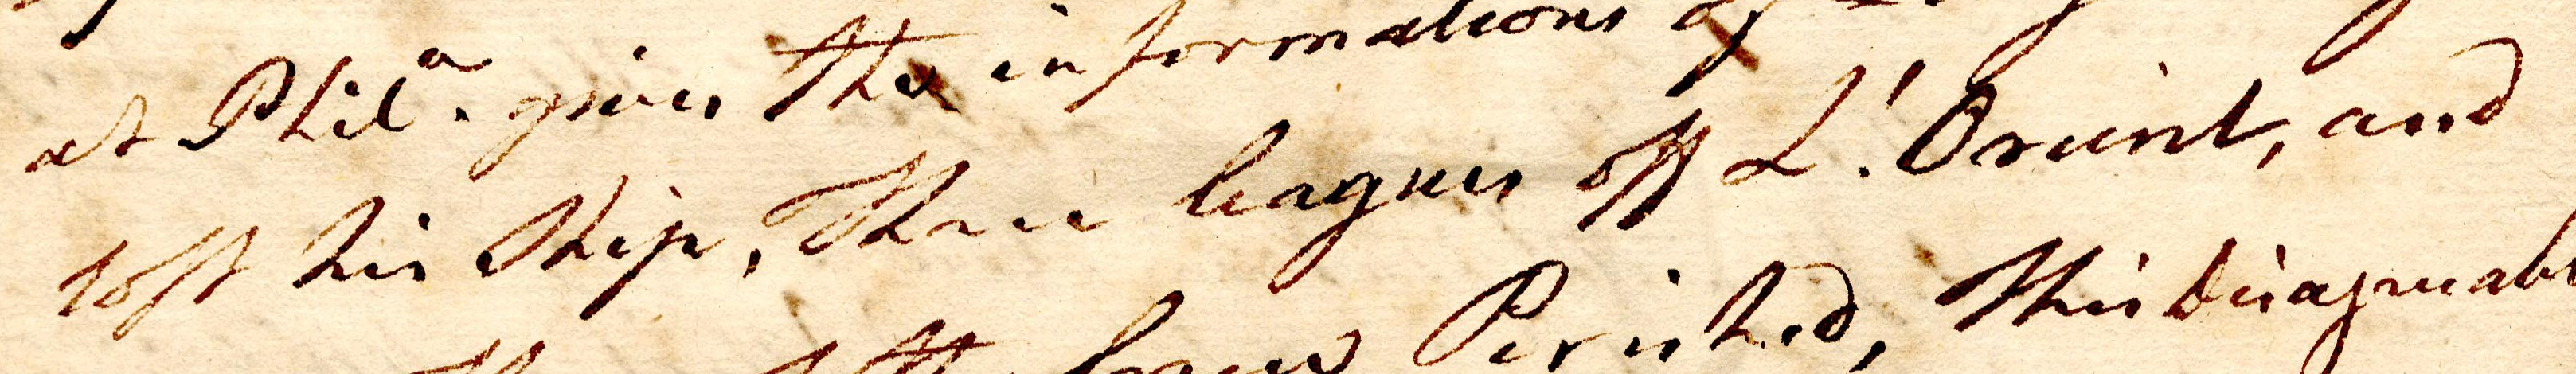lost his Ship, Three leagues off L.'Orient, and
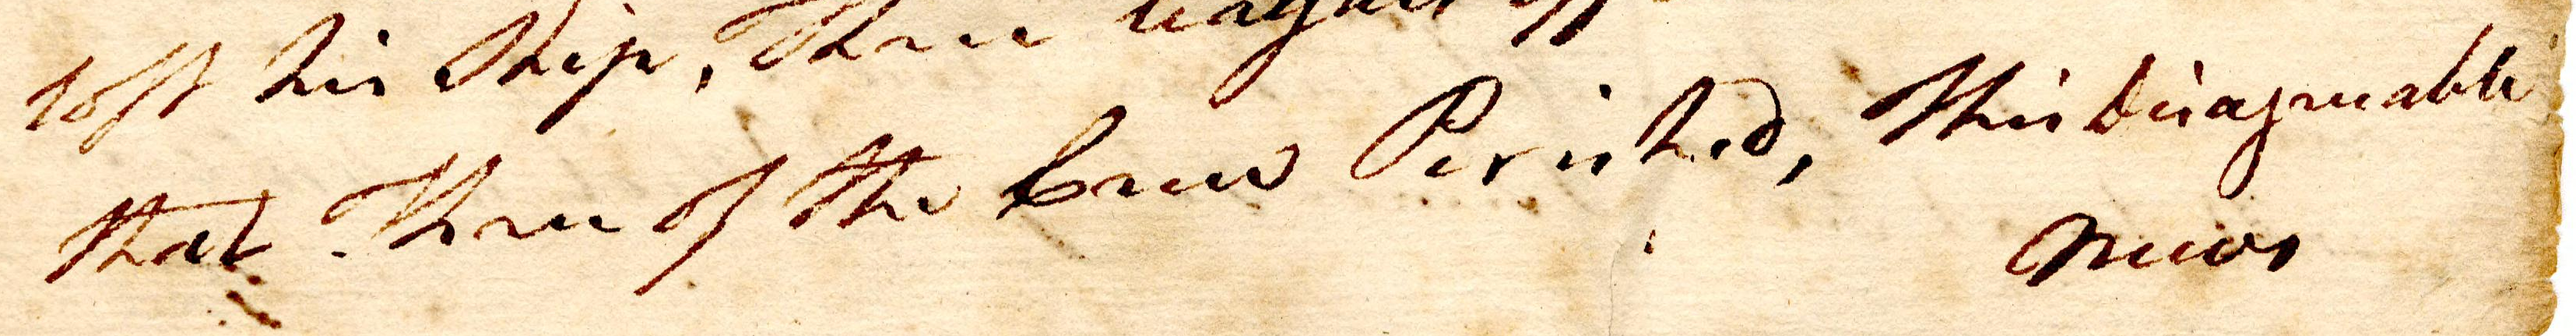that Three of the Crew Perished, This Disagreable
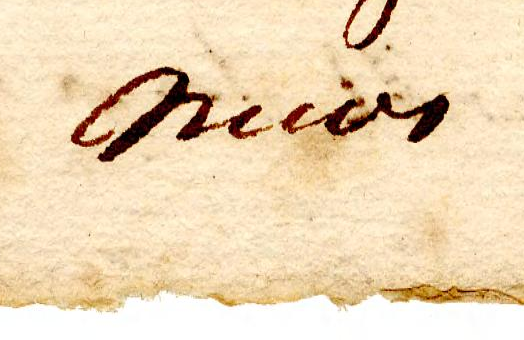news
